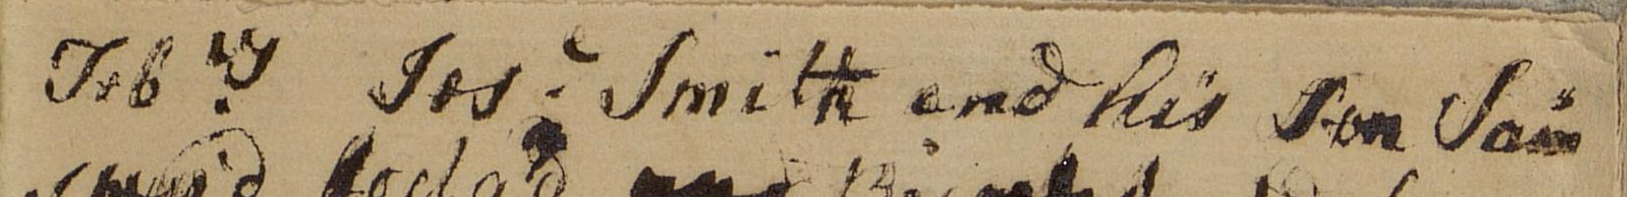Feb^ry. Jos^e. Smith and his Son Sam^l
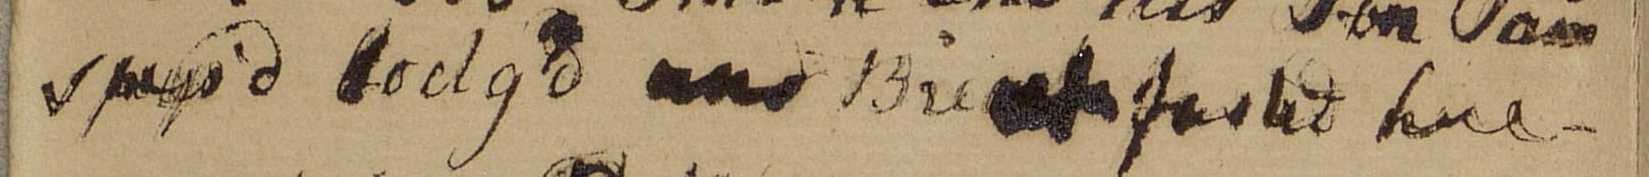sup'd lodg'd and Breakfasted here-
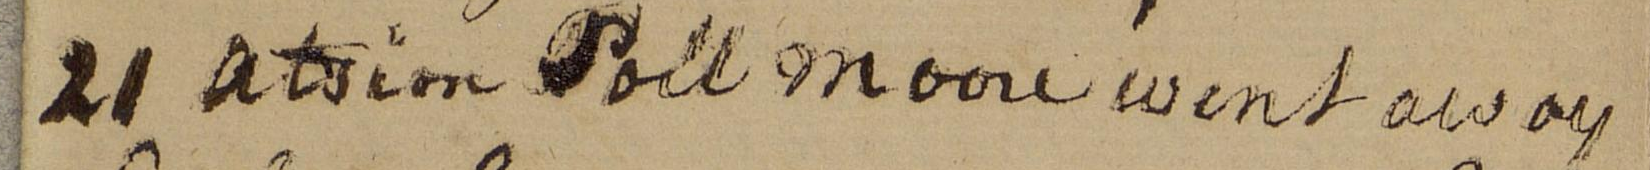21 Atsion Poll Moore went away
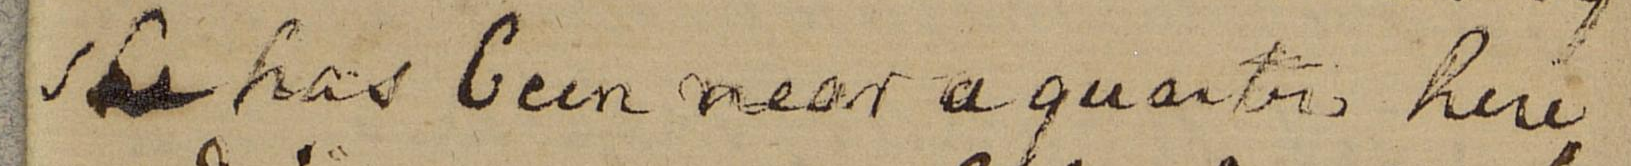she has been near a quarter here,
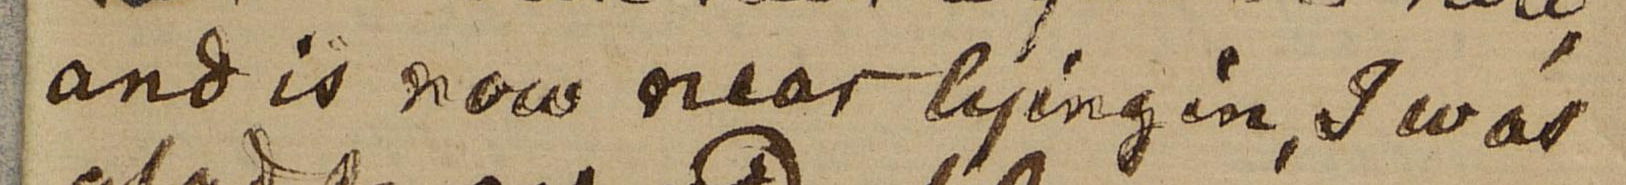and is now near lying in, I was
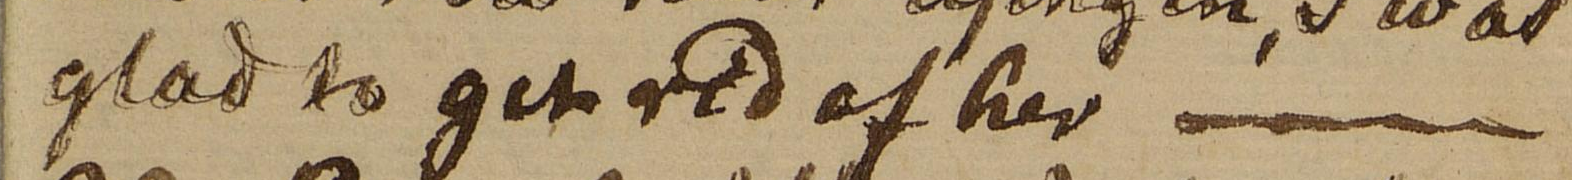glad to get rid of her-
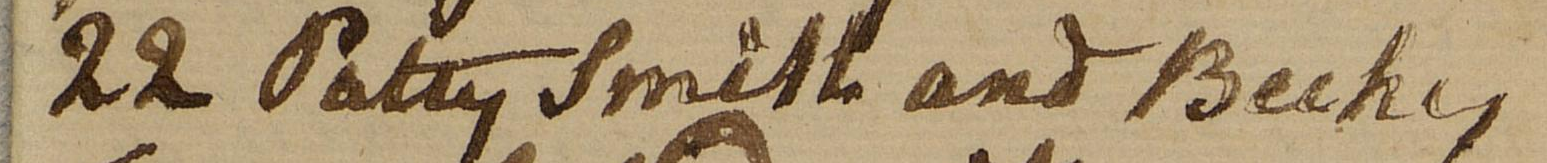22 Patty Smith and Becky
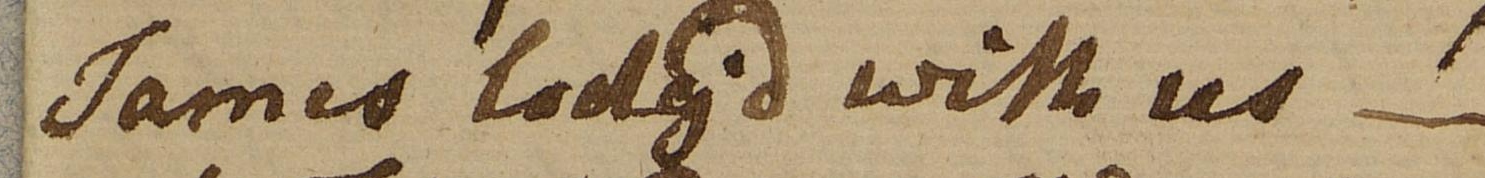James lodg'd with us-
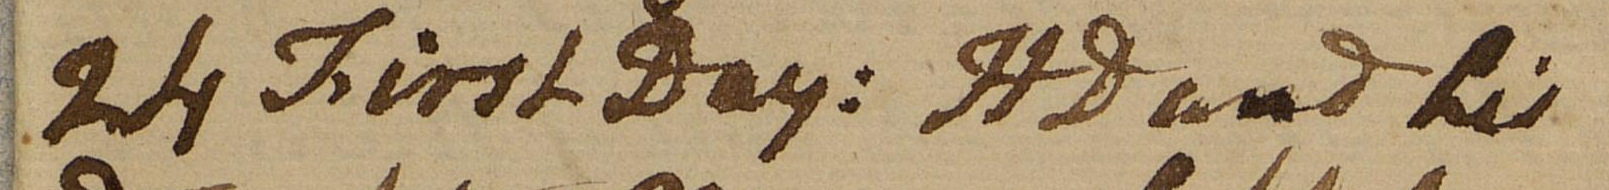24 First Day: HD and his
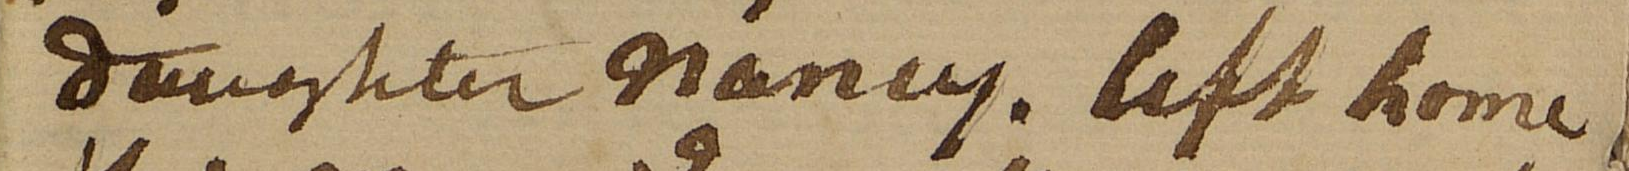daughter Nancy. left home
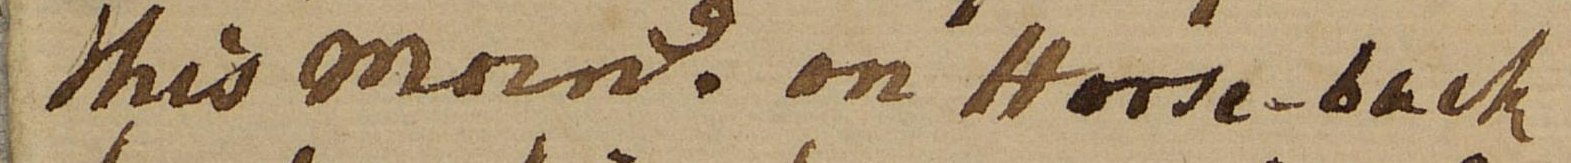this Morn^g. on Horse-back
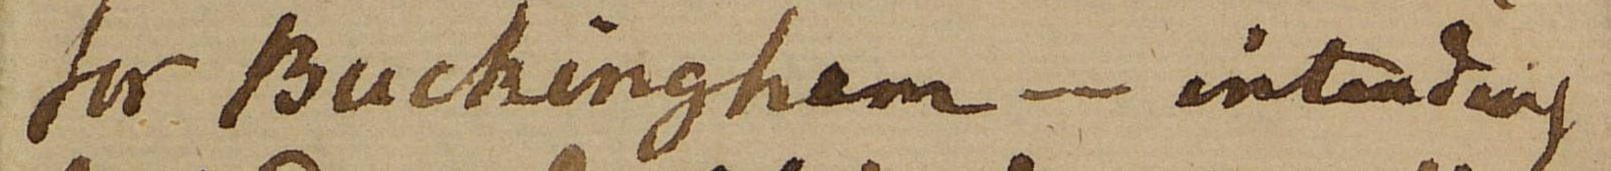for Buckingham- intending
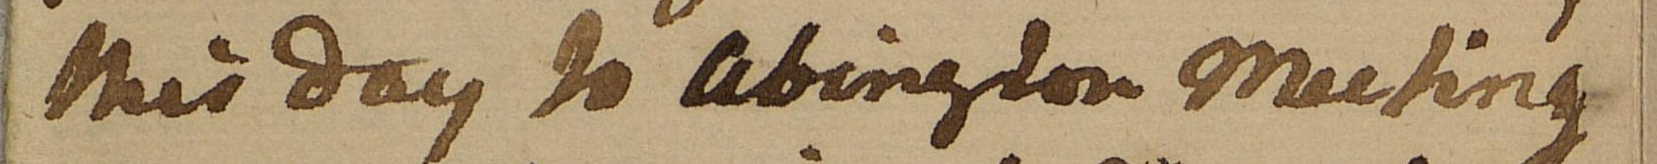this day to Abington Meeting
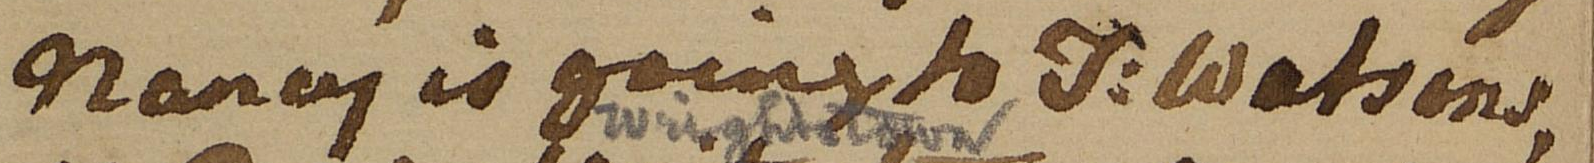Nancy is going to T: Watsons,
